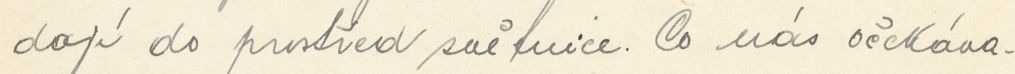dají do prostřed světnice. Co nás očekáva-
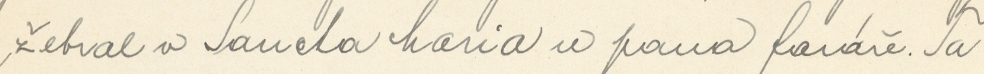žebral v Santa Maria u pana faráře. Ta
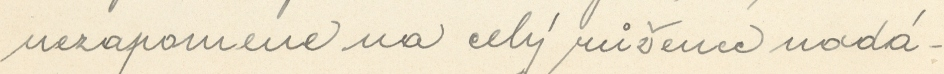nezapomene na celý růženec nadá-
